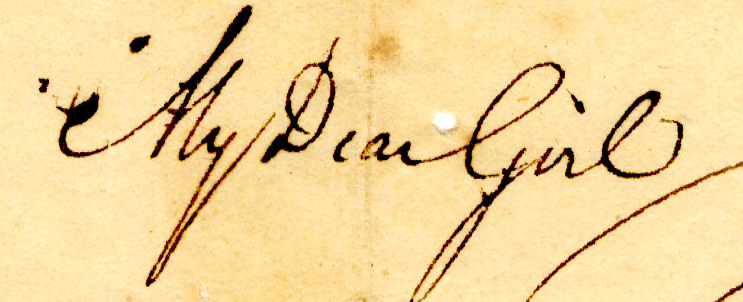My Dear Girl
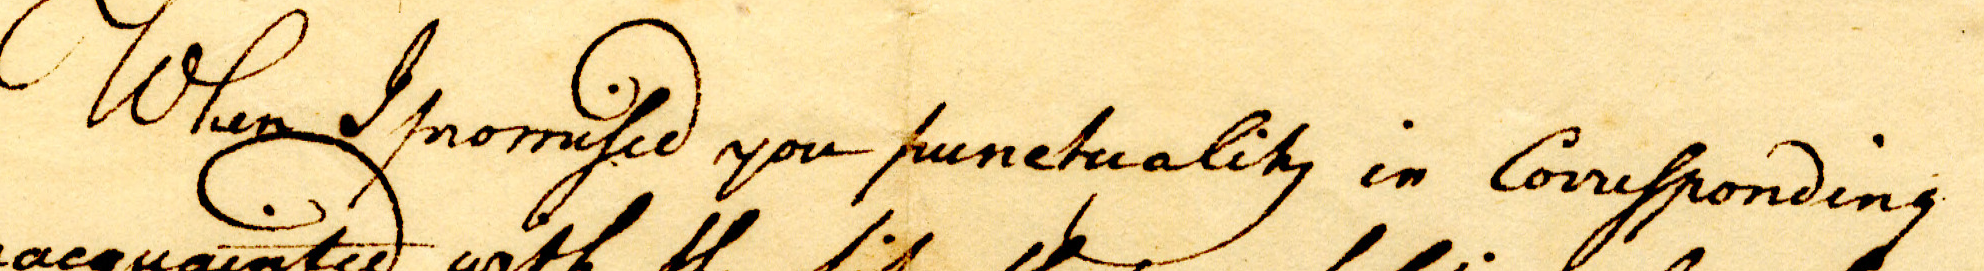When I promised you punctuality in corresponding
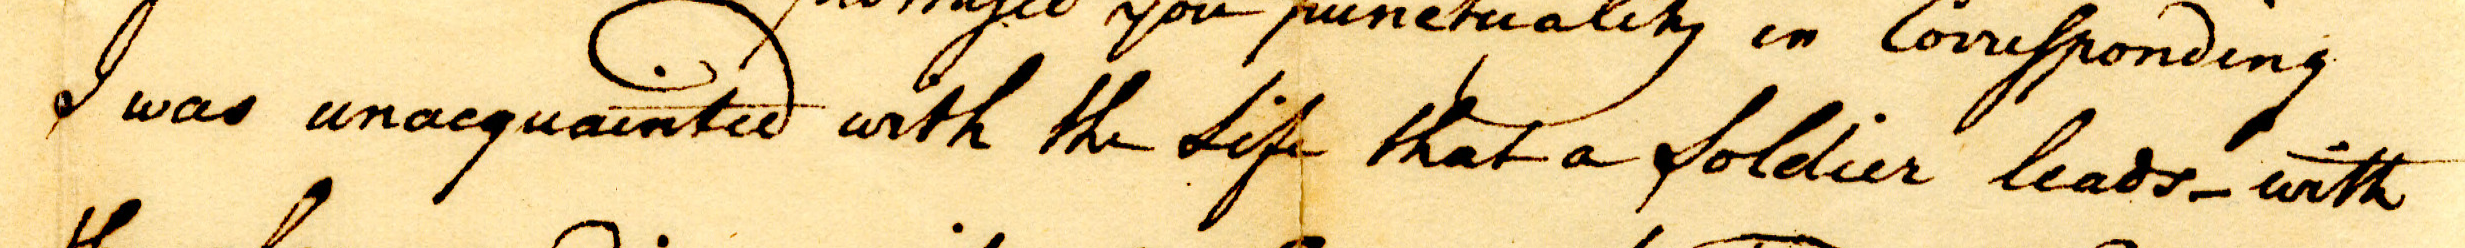I was unacquainted with the Life that a Soldier leads- with
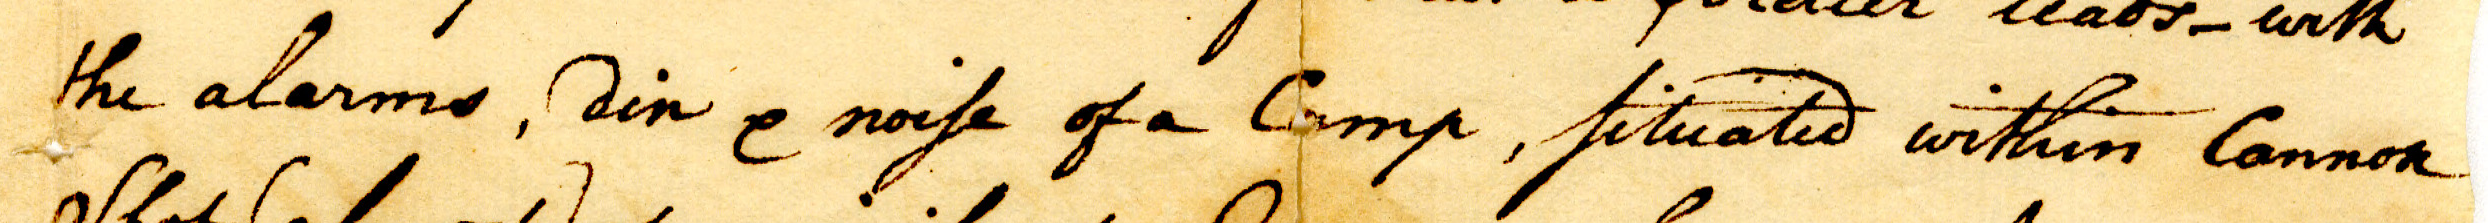the alarms, din & noise of a Camp, situated within Cannon
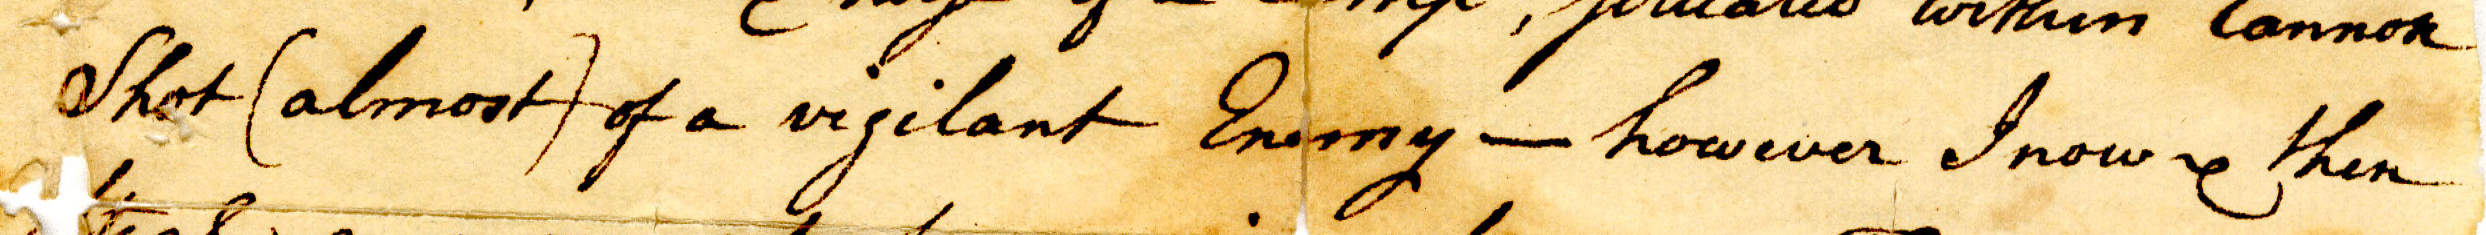Shot (almost) of a vigilant Enemy- however I now & then
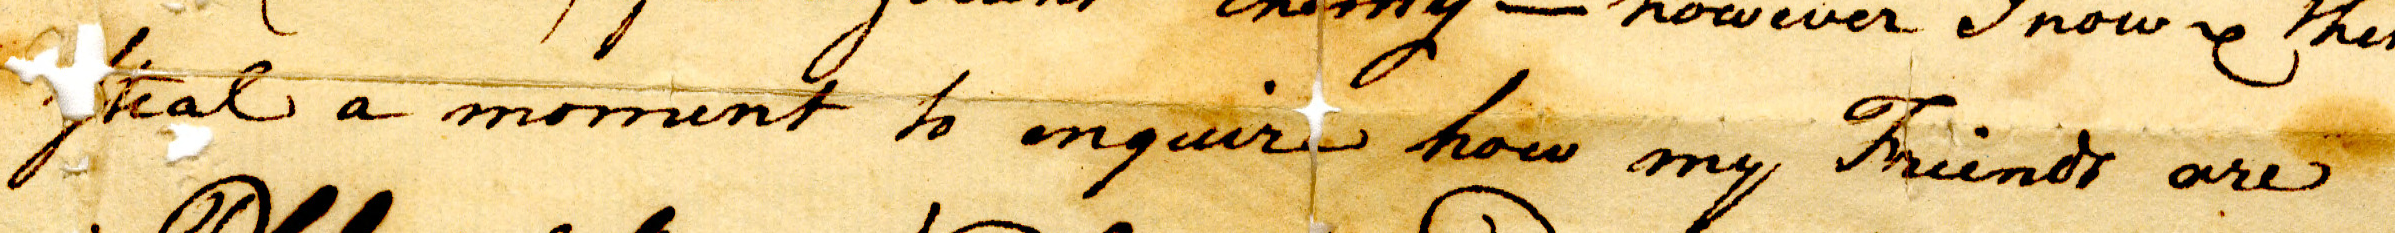steal a moment to enquire how my Friends are
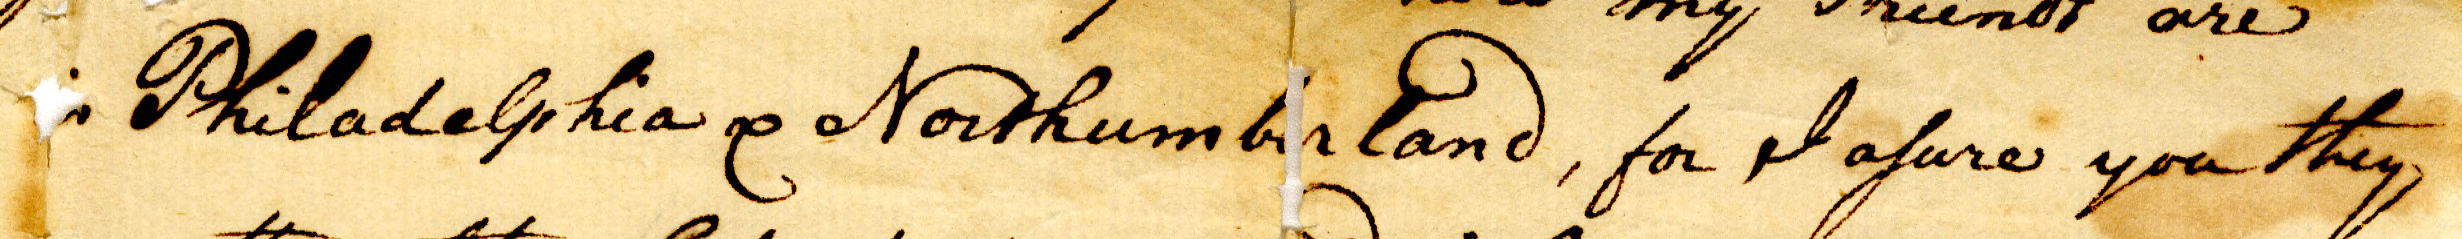in Philadelphia & Northumberland, for I assure you they
